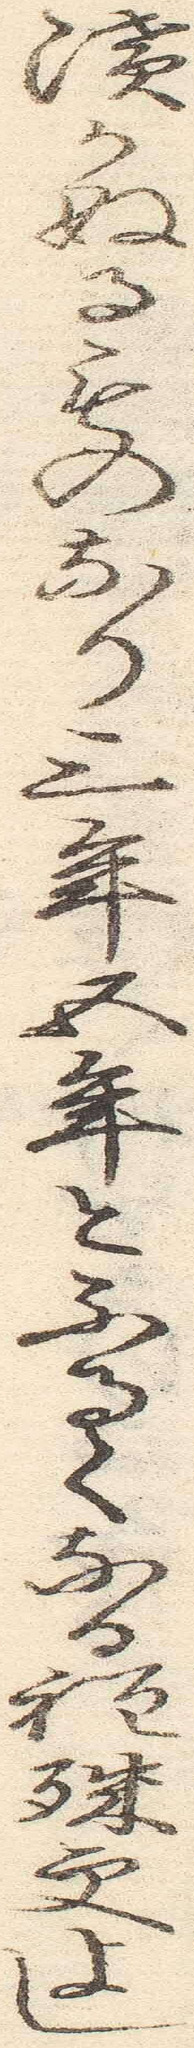漬かぬるものなり三年五年とふるくなる程殊更よし
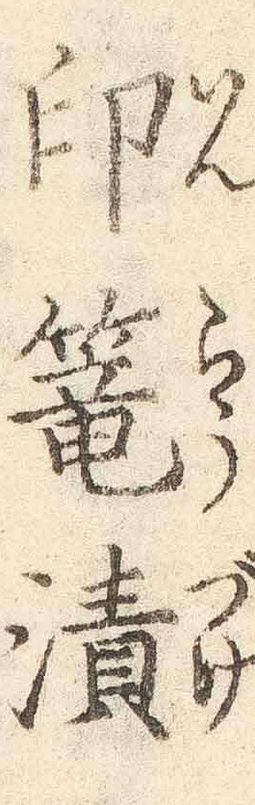印篭漬
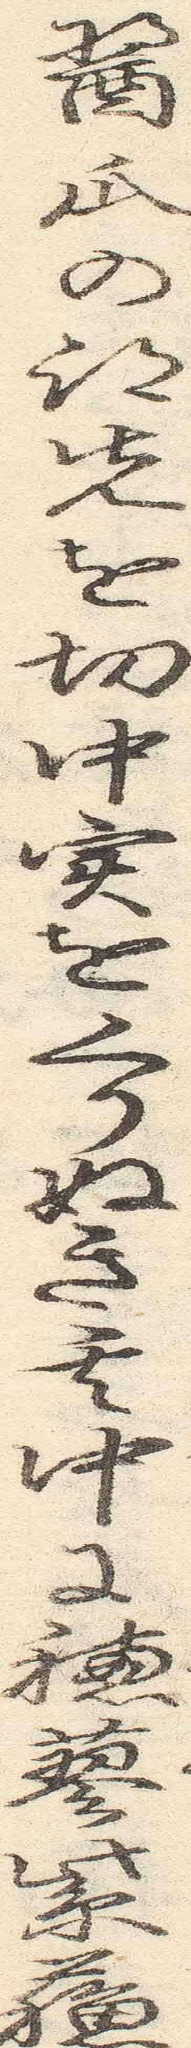醤瓜の跡先を切中実をくりぬき其中に歩穂蓼紫蘇
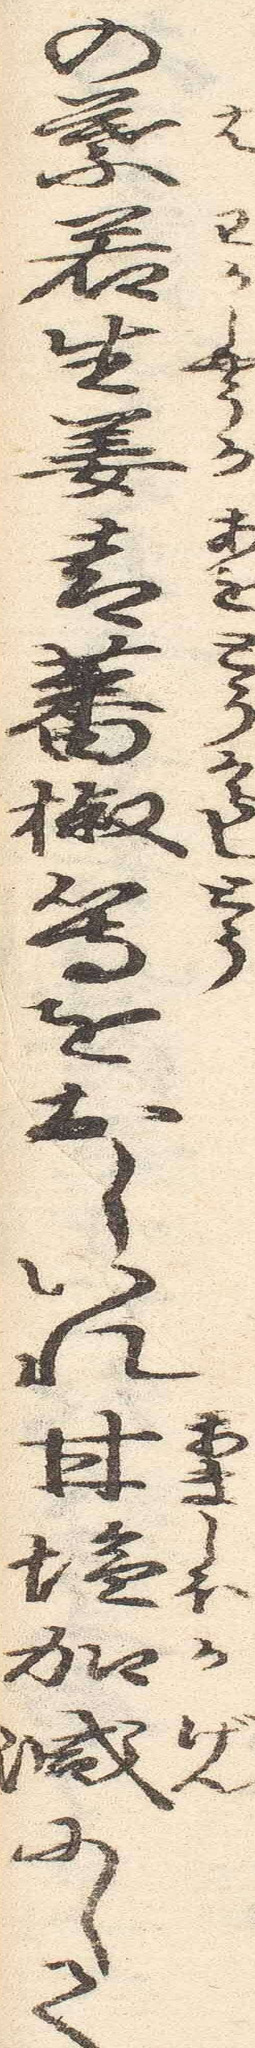の葉若生姜青蕃椒等をおしいれ甘塩加減にして
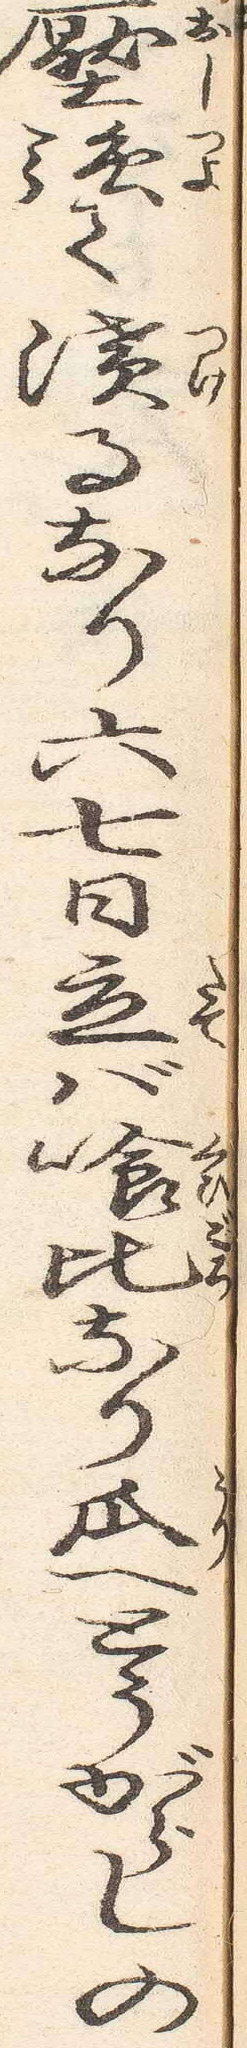圧強て漬るなり六七日立ば喰比なり瓜へとうがらしの
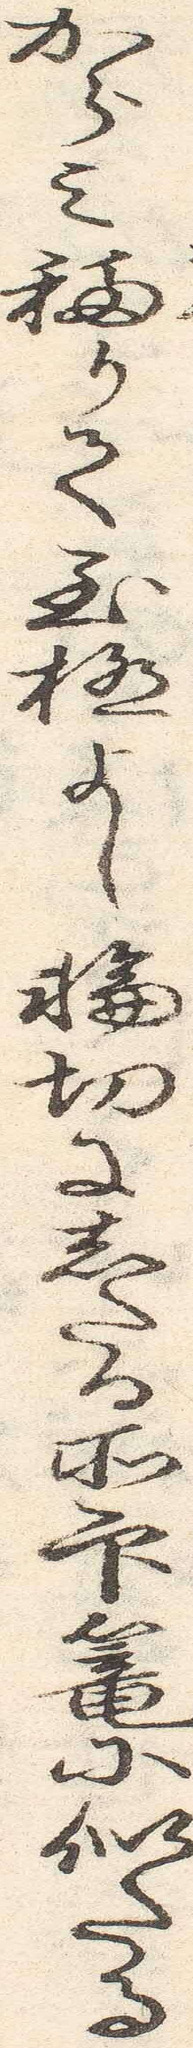からみ移りて至極よし輪切にしたる所印篭に似たる
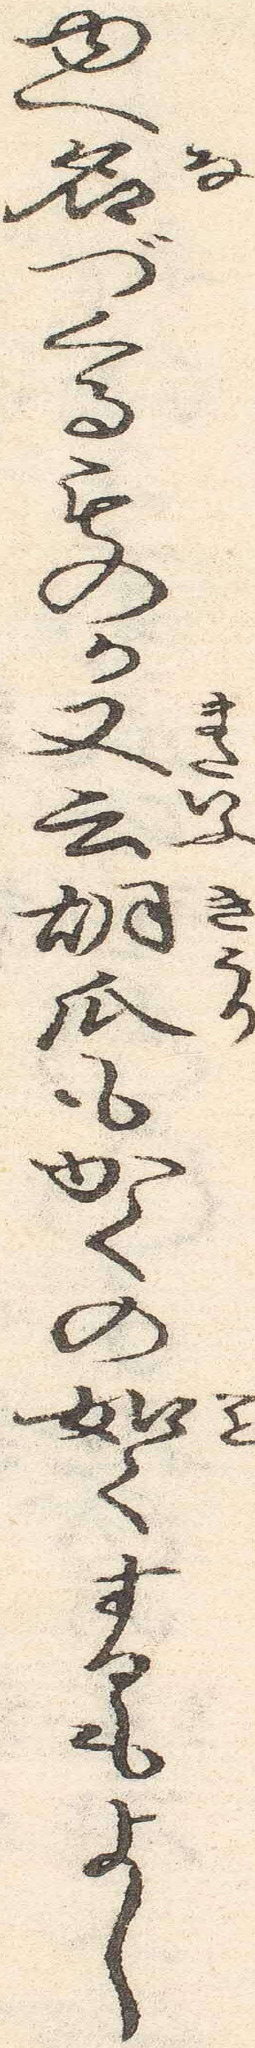ゆへ名づくるものか又云胡瓜もかくの如くするもよし
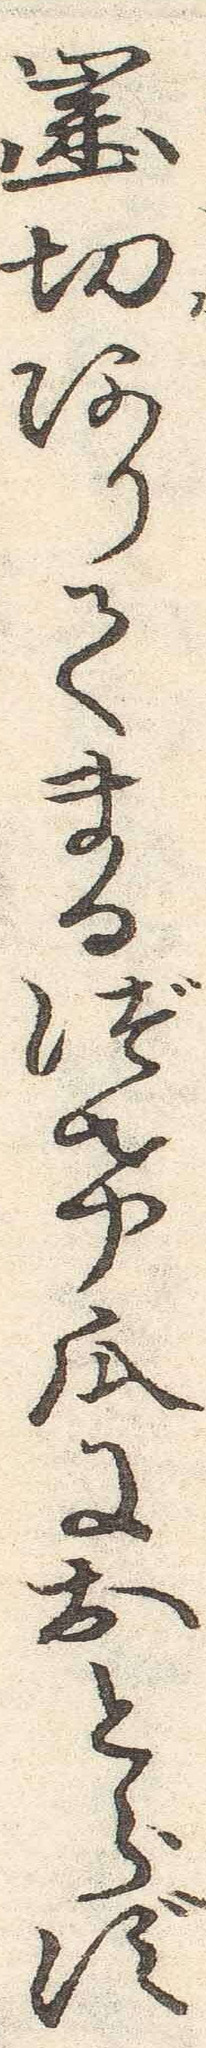歯切ありてまるづけ瓜におとらず
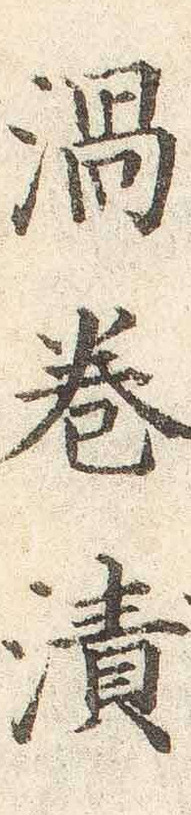渦巻漬
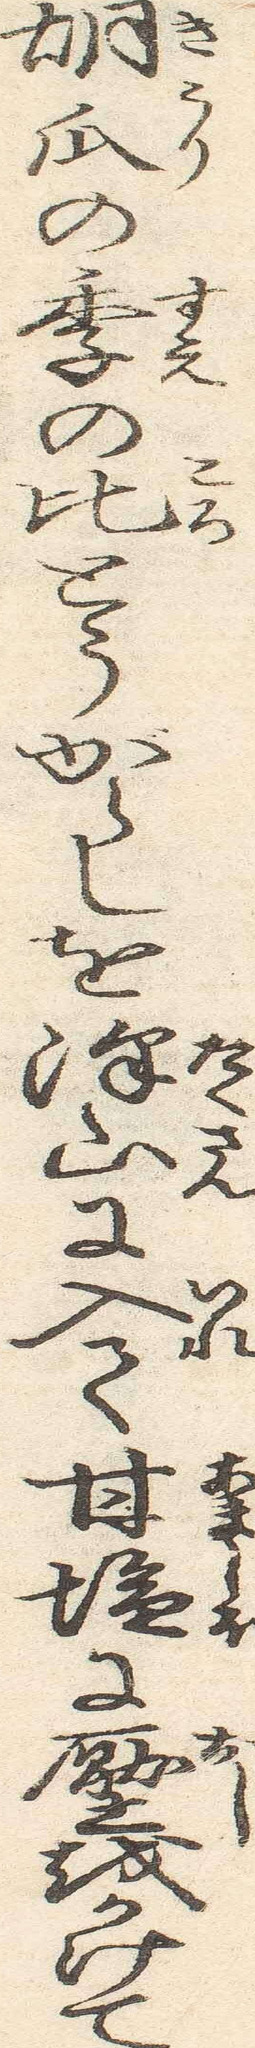胡瓜の季の比とうがらしを沢山に入て甘塩に圧をかけて
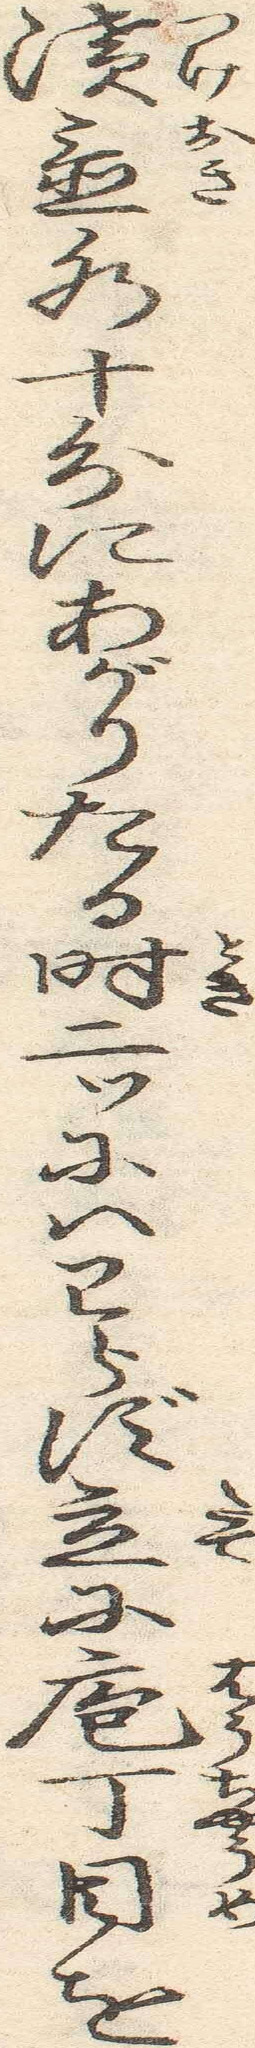漬置水十分にあがりたる時二ッにはわらず立に庖丁目を
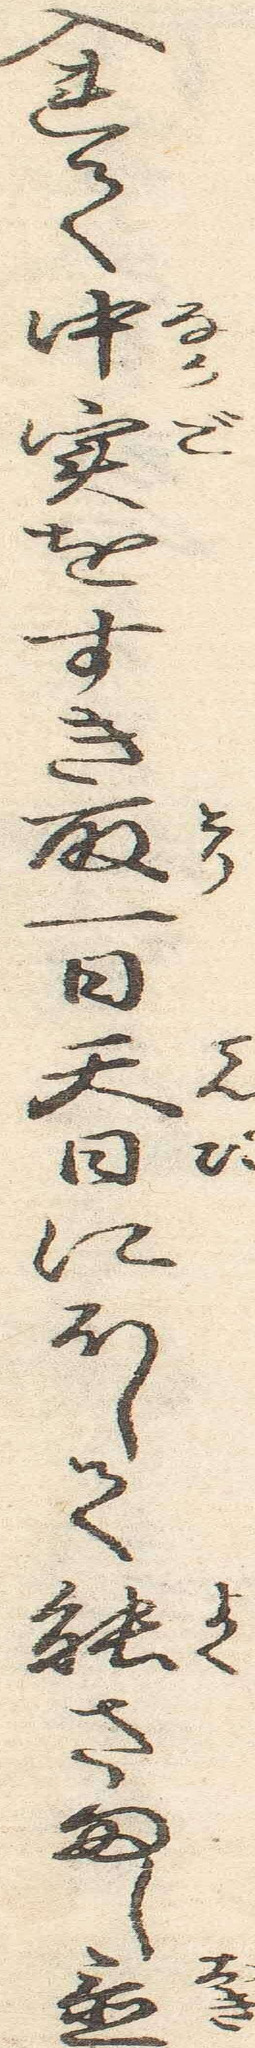入れて中実をすき取一日天日にほして能さまし置
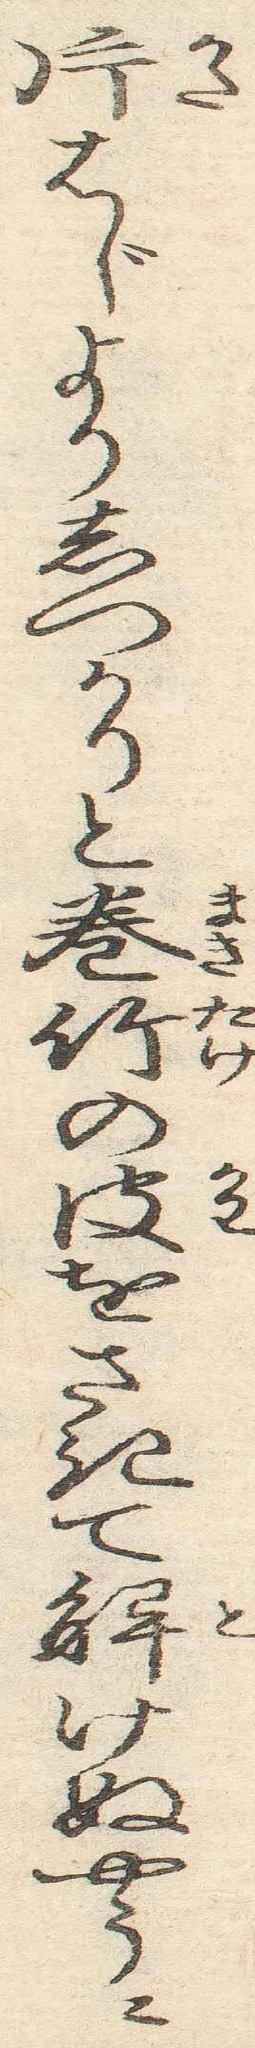片はじよりしつかりと巻竹の皮をさきて解けぬやうに

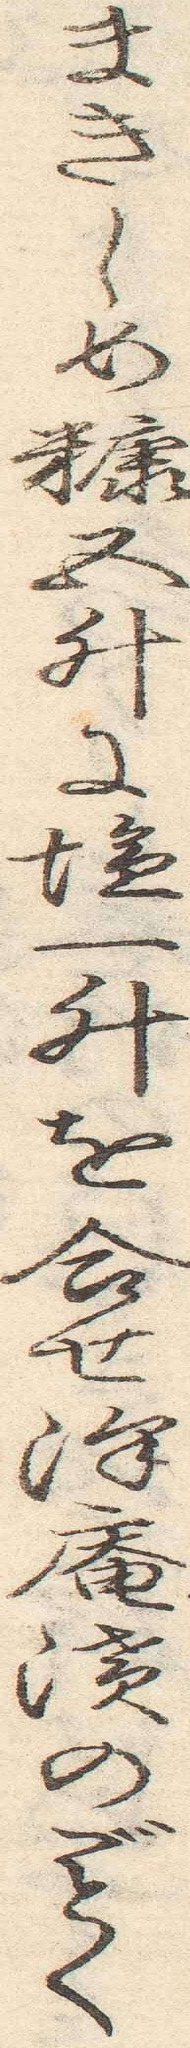まきしめ糠五升に塩一升を合せ沢庵漬のごとく
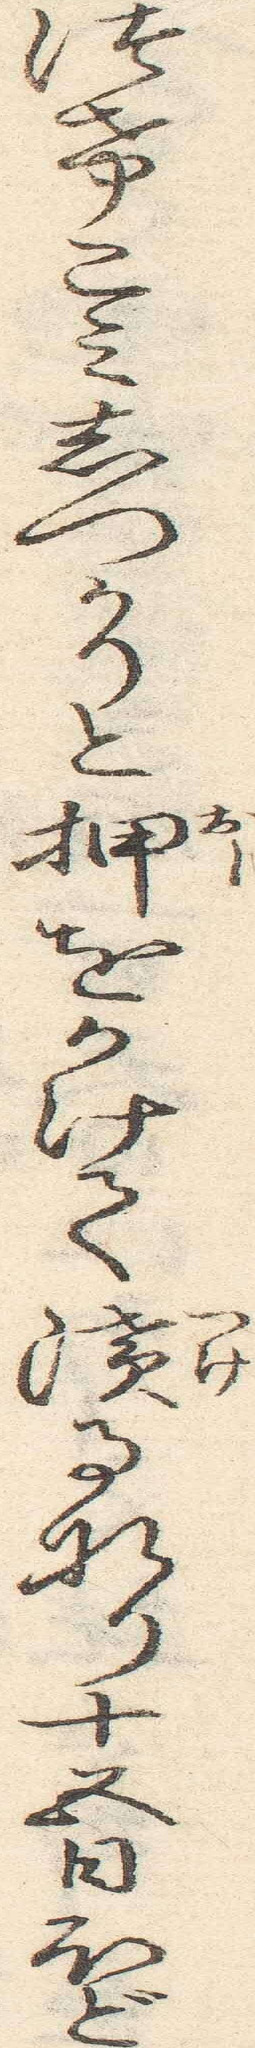つけこみしつかりと押をかけて漬るなり十五日ほど
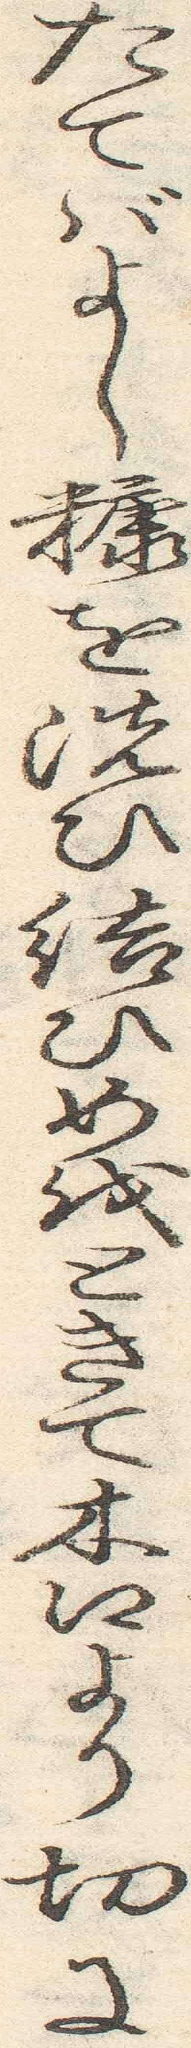たてばよし糠を洗ひ結ひめをときて木口より切に
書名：四季漬物塩嘉言
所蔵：東京学芸大学附属図書館 国文学研究資料館
